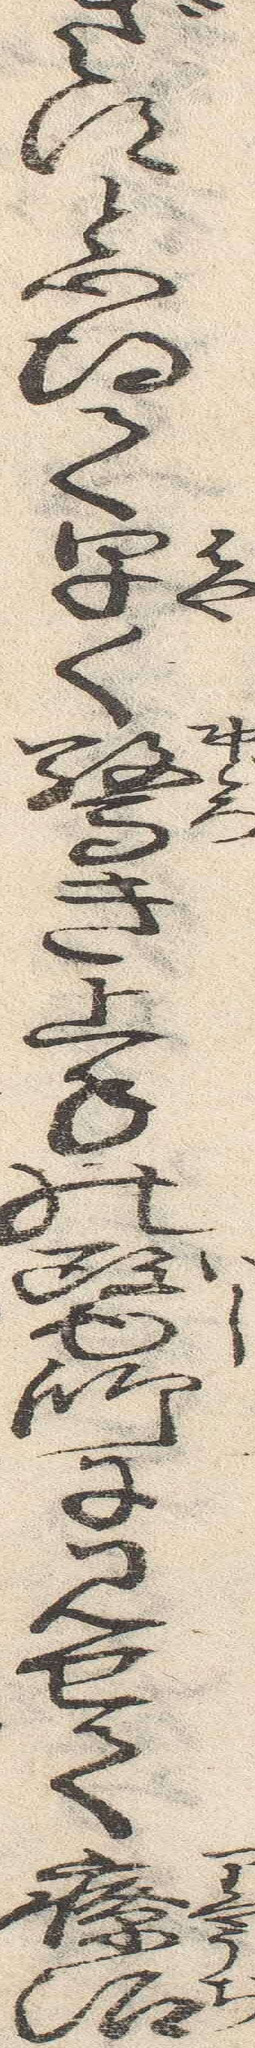ざすと心得て早く驚き上手の医師に見せて療治
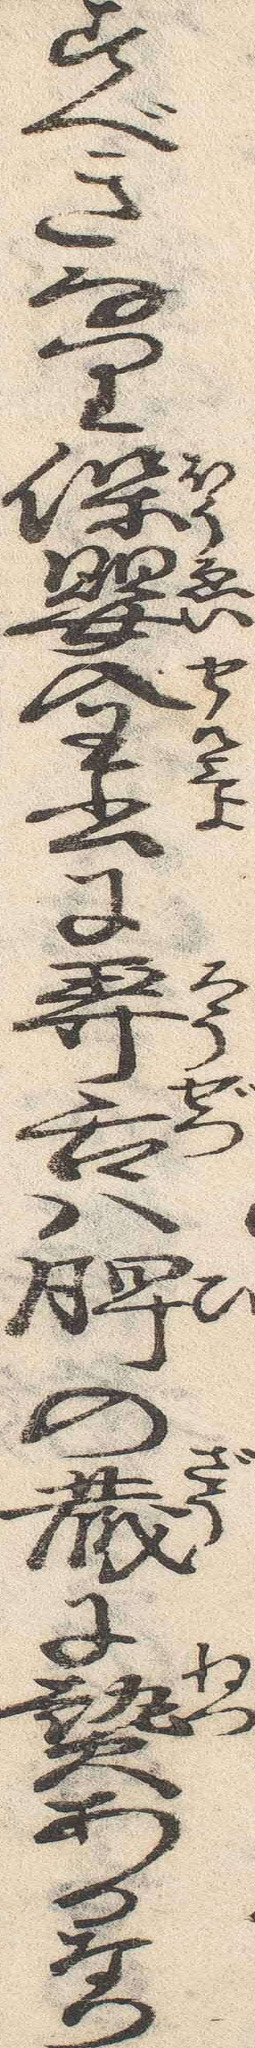すべきなり保嬰全書に弄舌は脾の蔵に熱あるなり
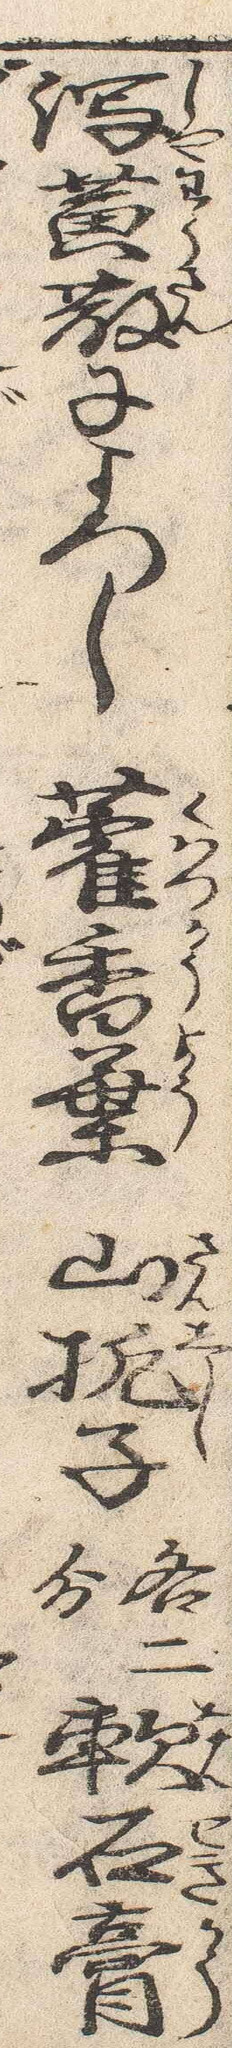瀉黄散によろし藿香葉山梔子各二分軟石膏
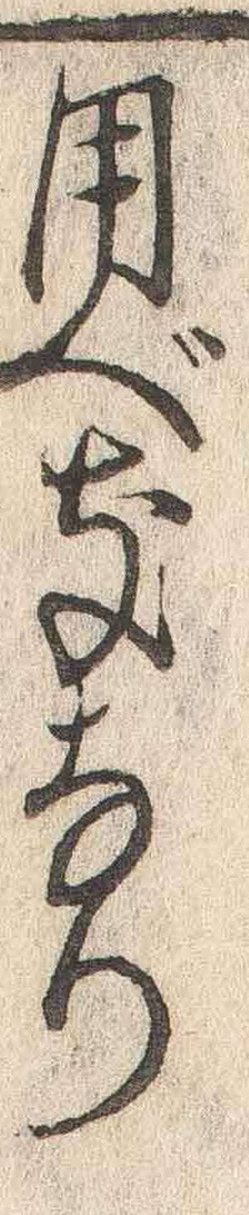用べきなり
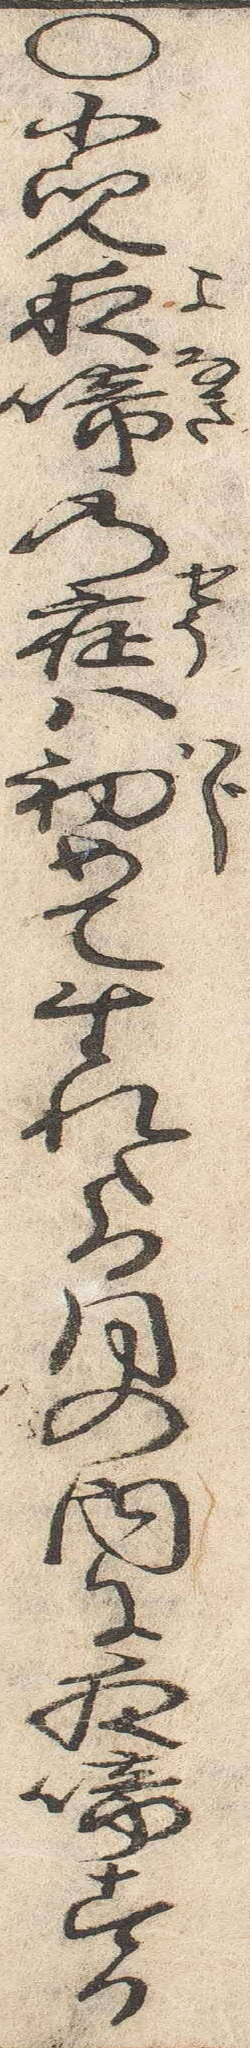○小児夜啼の症は初めて生れたる月の内に夜啼する
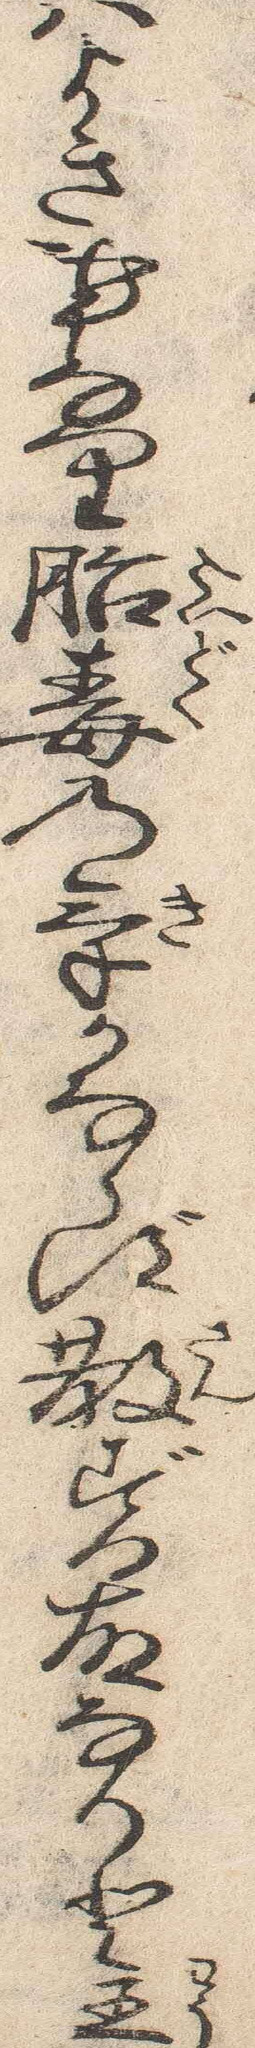はよき事なり胎毒の気かならず散ずる故なりと王
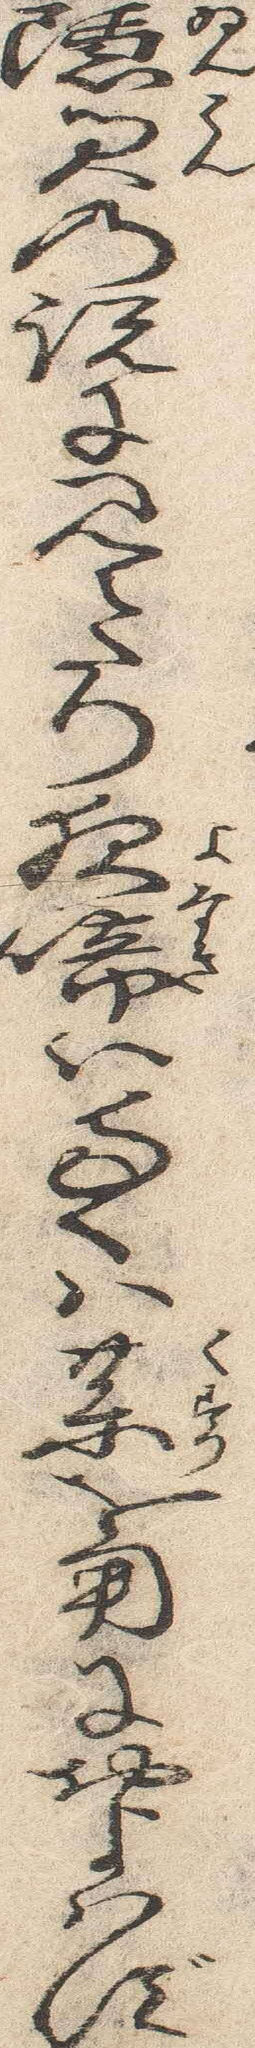隠君の説に見えたり夜啼は多くは薬を用におよはず
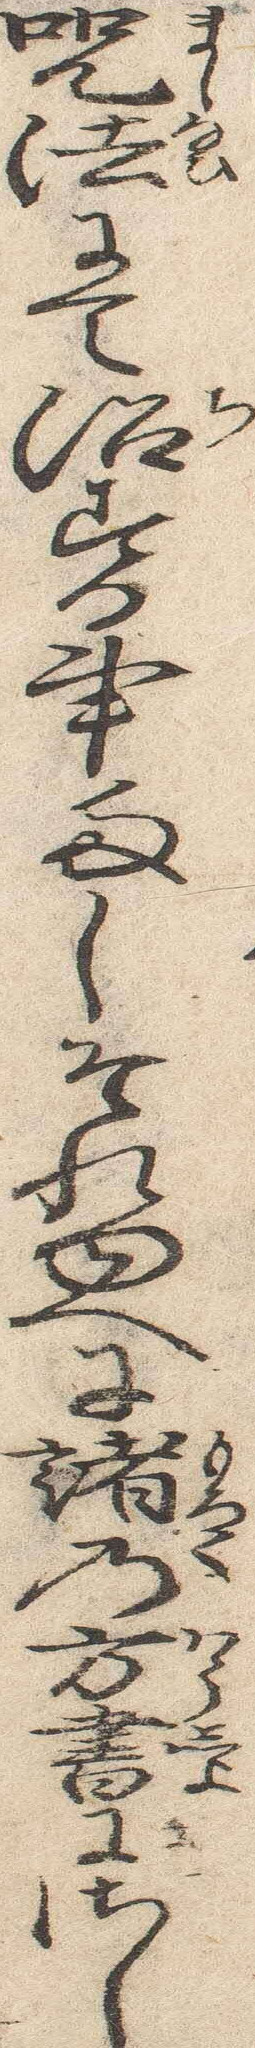呪法にて治する事多しそれゆへに諸の方書にさし
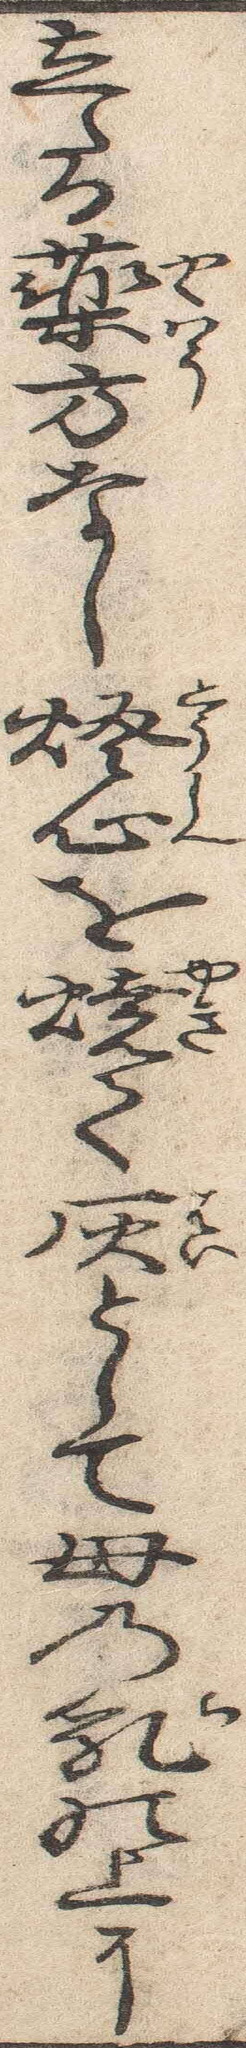立たる薬方なし灯心を焼て灰として母の乳の上に
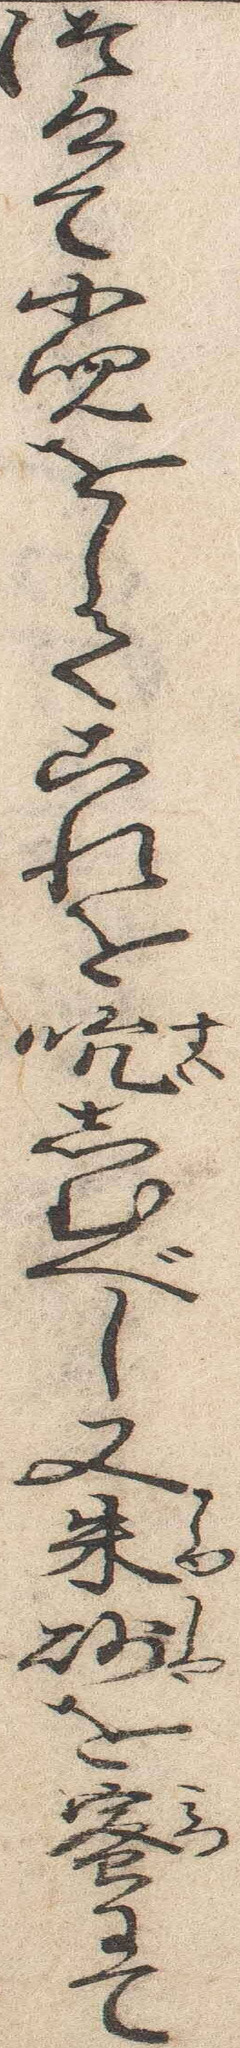つけて小児をしてこれを吮しむべし又朱砂を蜜にて
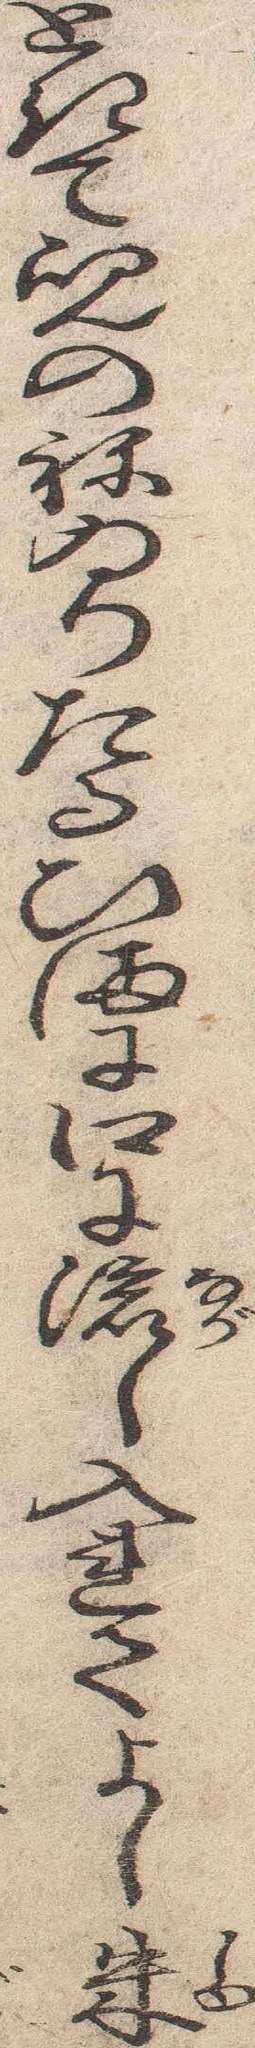ときて児のねゐりたるひまに口に流し入れてよし朱
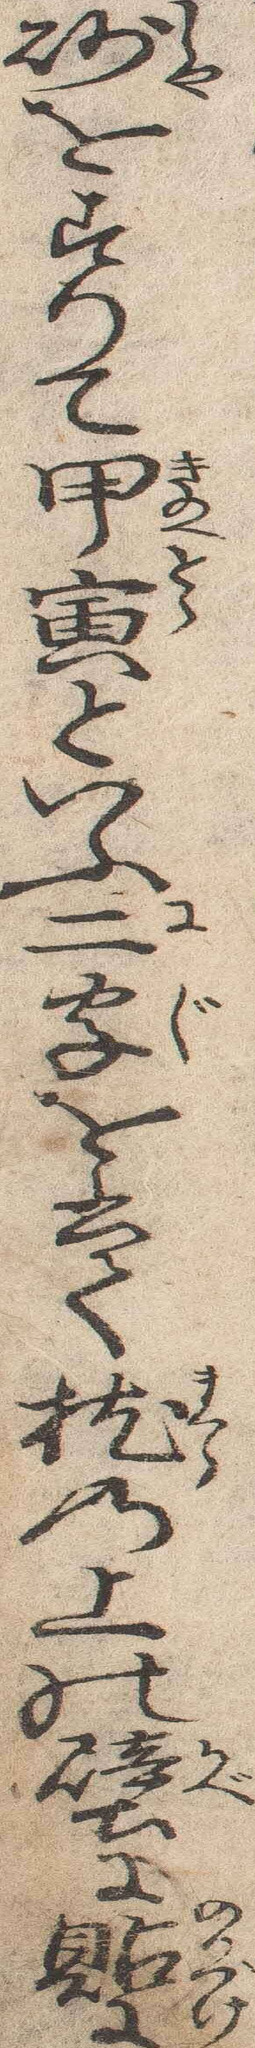砂をすりて甲寅といふ二字を書て枕の上の壁に貼に

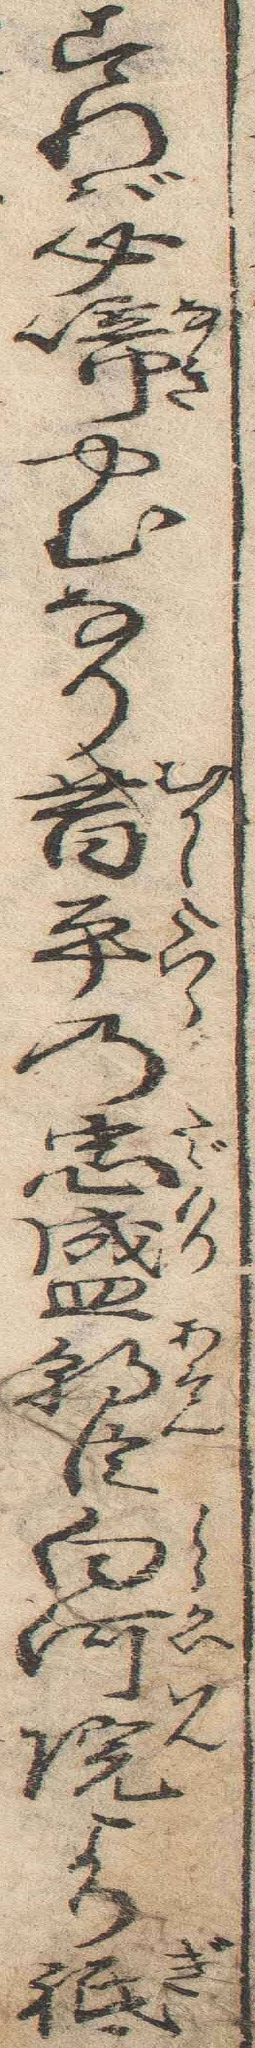すれば必啼やむなり昔平の忠盛朝臣白河院より祇
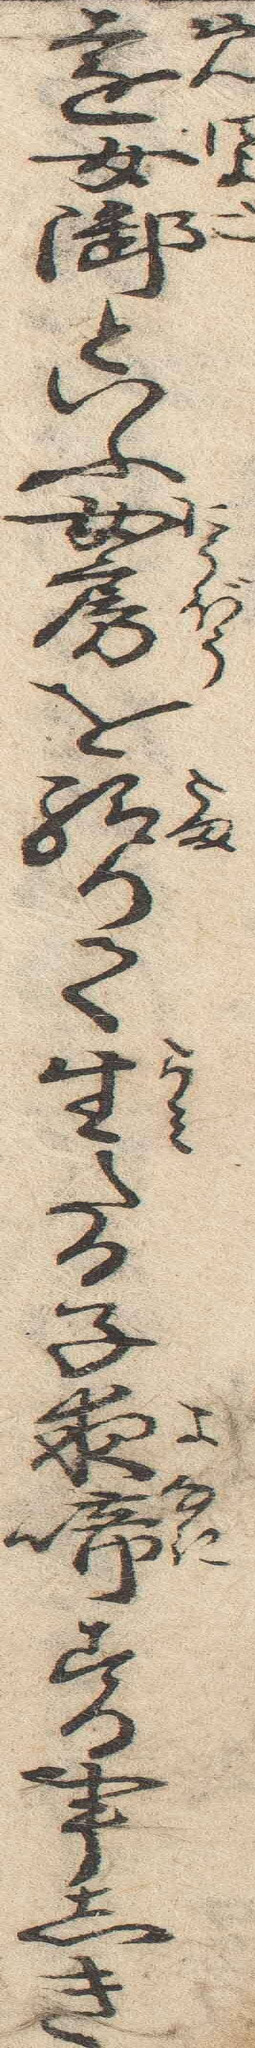遠女御といふ女房を給りて生たる子夜啼する事しき
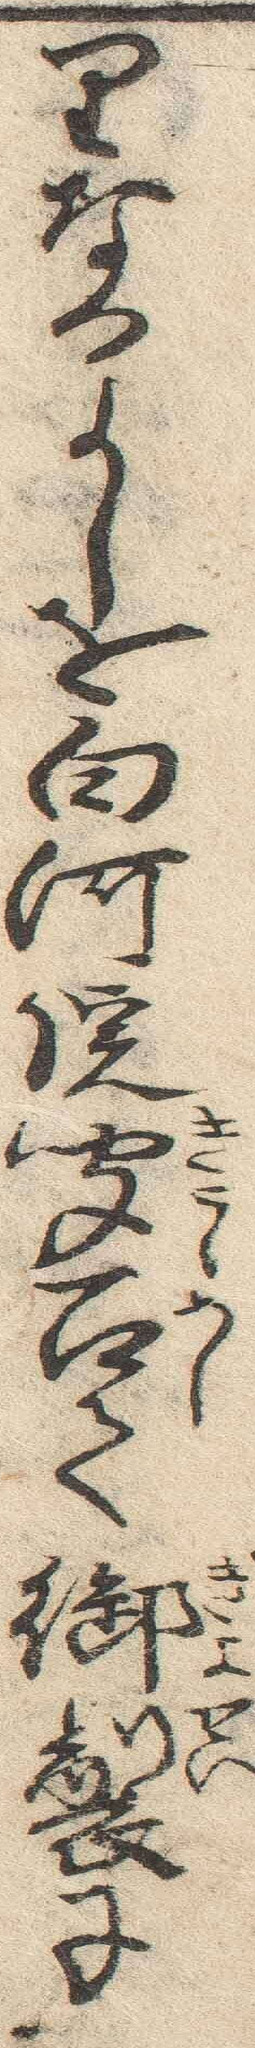りなるよしを白河院聞召て御製に
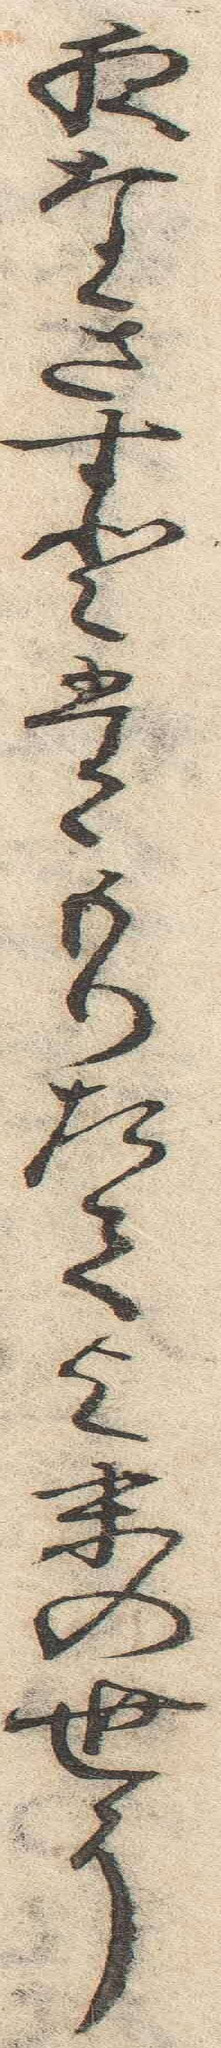夜なきすとたゝもりたてよ末の世に
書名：小児必用養育草
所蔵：東京学芸大学附属図書館 国文学研究資料館
